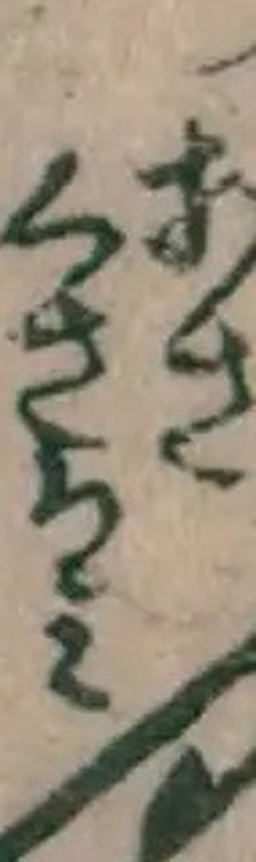くさかみ
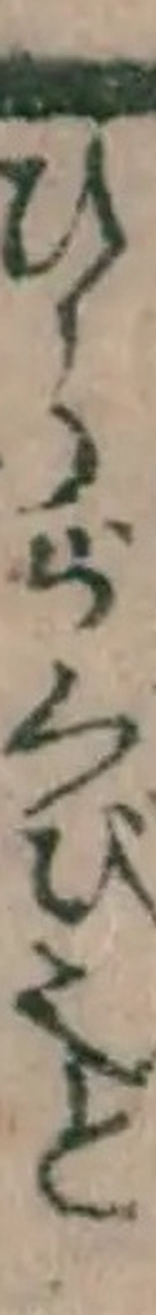ひらくび也と
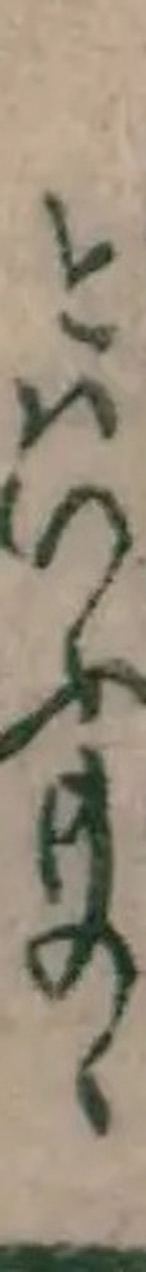とはいふものゝ
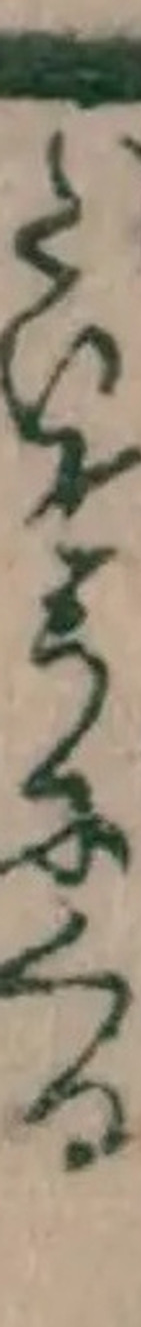たいそうなくる
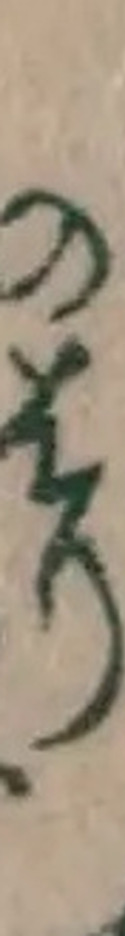のはり
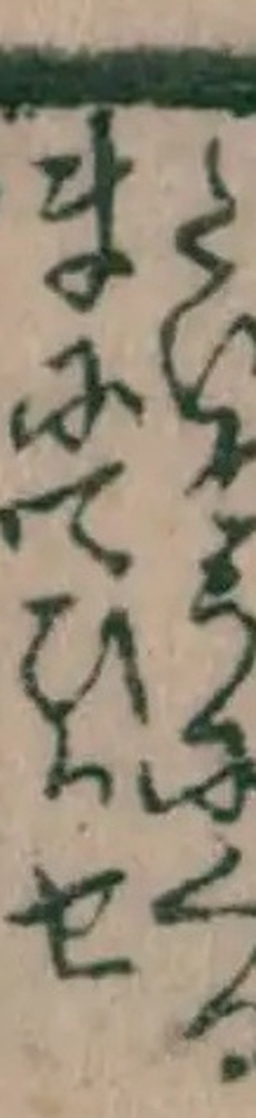まにてひかせ
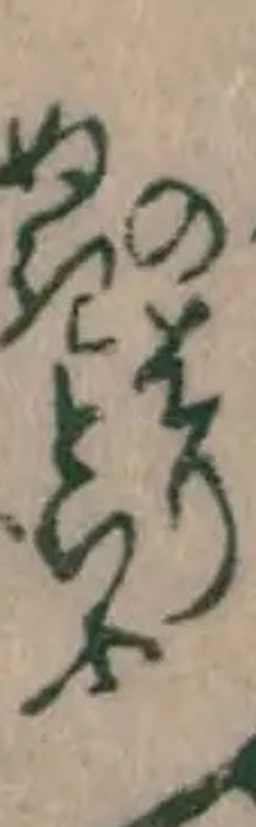ぬきといふ
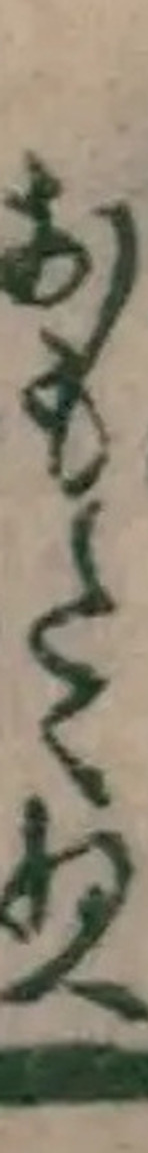おもたくねへ
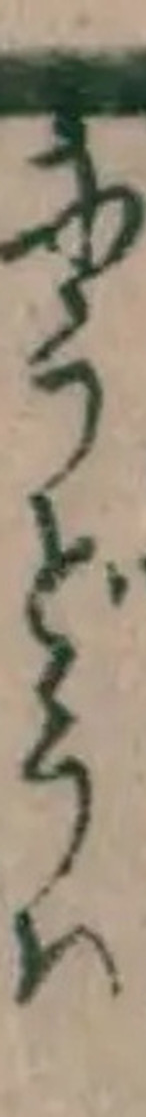にうどうは
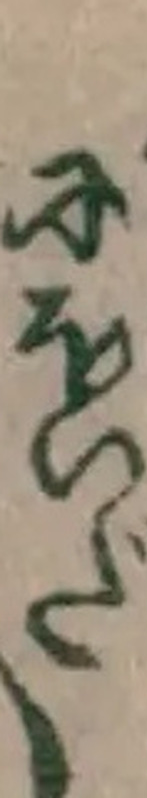にほいだ
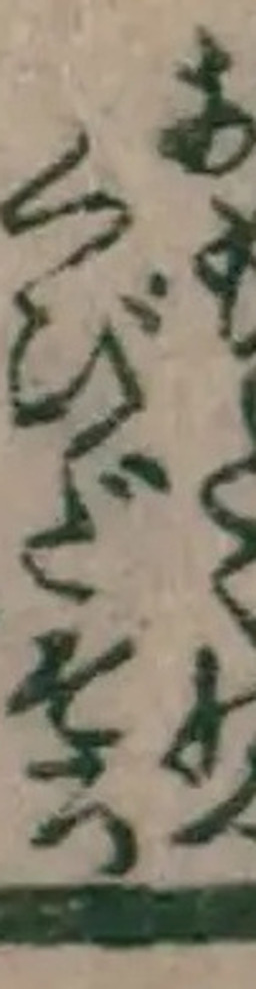くびだそう
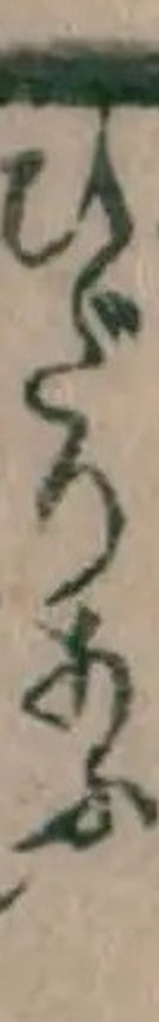ひだりあふ
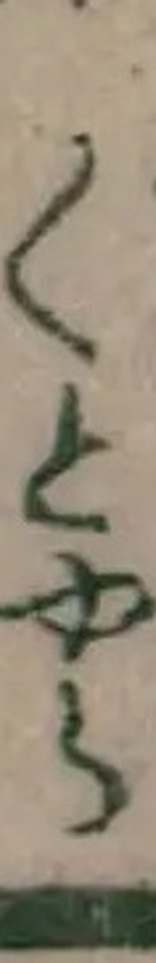〳〵とやら
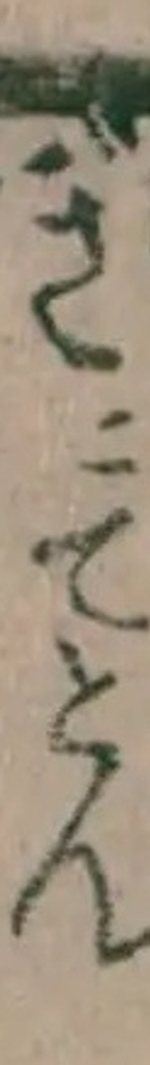ぎにてとん
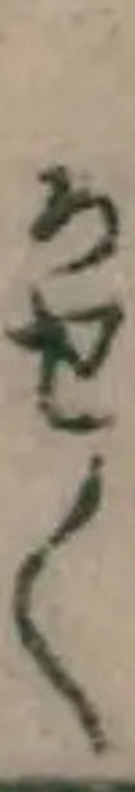かせ〳〵
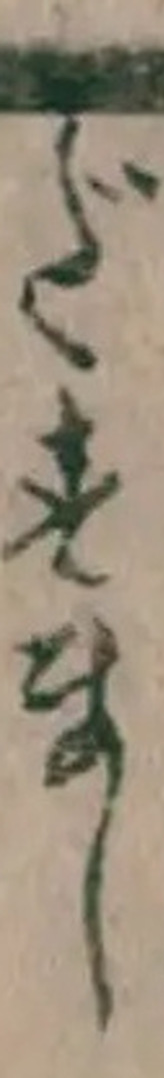だすまし
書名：信有奇怪会
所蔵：国立国会図書館 National Diet Library, JAPAN
